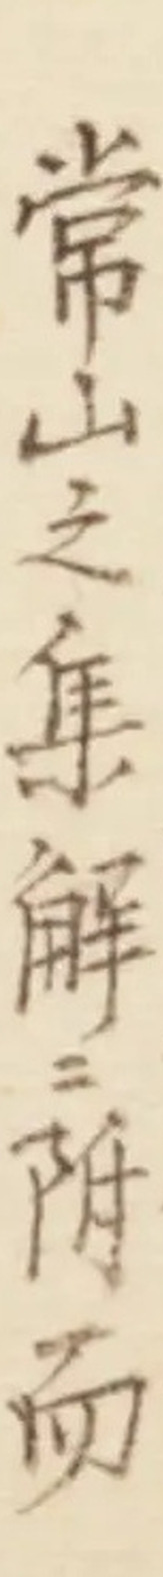常山之集解ニ附而
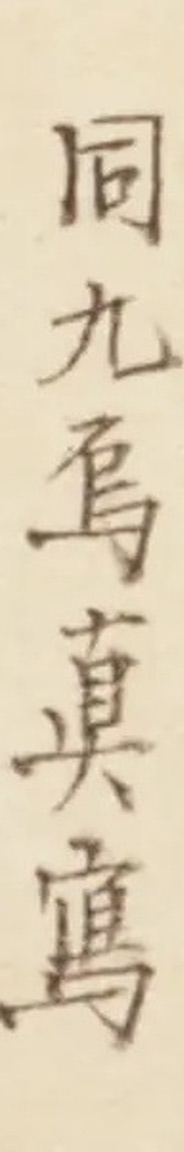同九烏真写
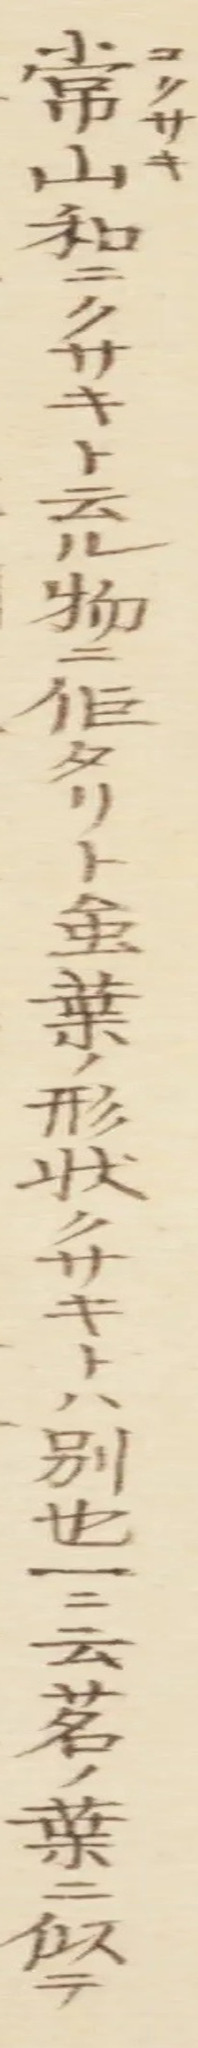常山和ニクサキト云ル物ニ佢タリト雖葉ノ形状クサキトハ別也一ニ云茗ノ葉ニ似テ
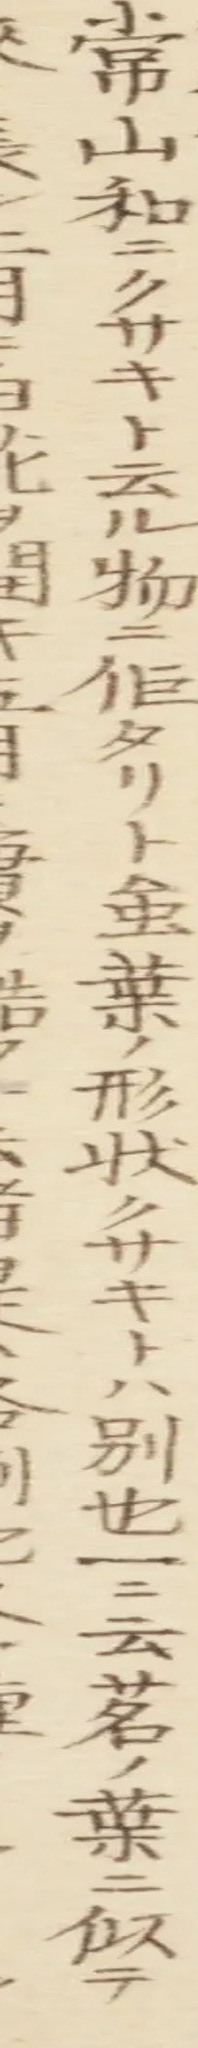常山和ニクサキト云ル物ニ佢タリト雖葉ノ形状クサキトハ別也一ニ云茗ノ葉ニ似テ
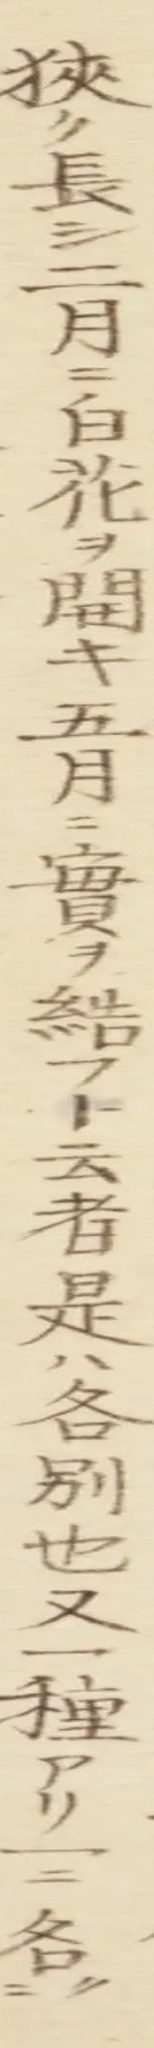狭ク長シ二月ニ白花ヲ開キ五月ニ実ヲ結フト云者是ハ各別也又一種アリ一ニ名
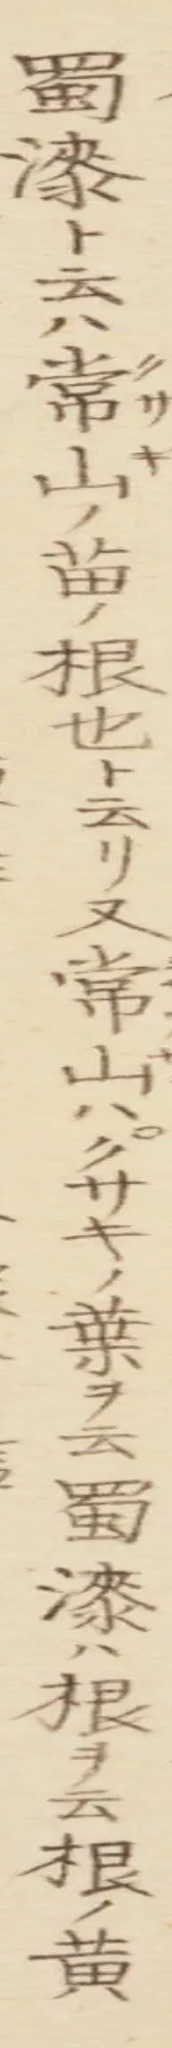蜀漆ト云ハ常山ノ苗ノ根也ト云リ又常山ハ。クサキノ葉ヲ云蜀漆ハ根ヲ云根ノ黄
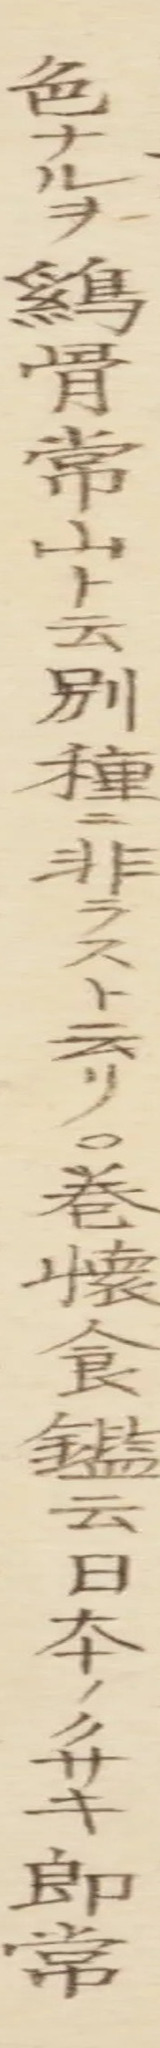色ナルヲ鶏骨常山ト云別種ニ非ラスト云リ◦巻懐食鑑云日本ノクサキ即常
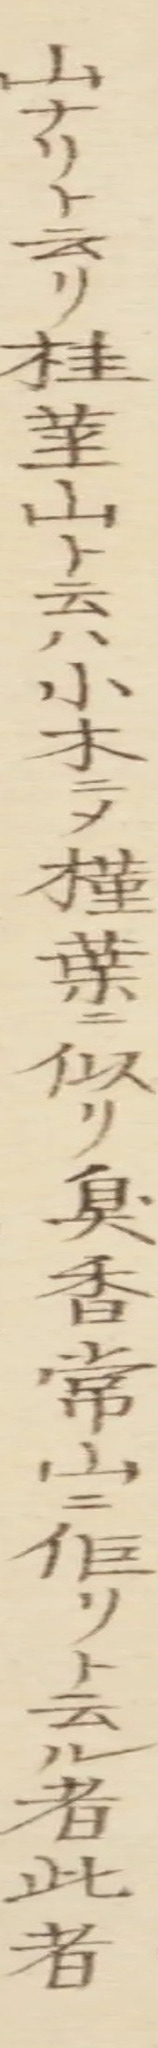山ナリト云リ桂茎山ト云ハ小木ニシテ槿葉ニ似リ臭香常山ニ佢リト云ル者此者
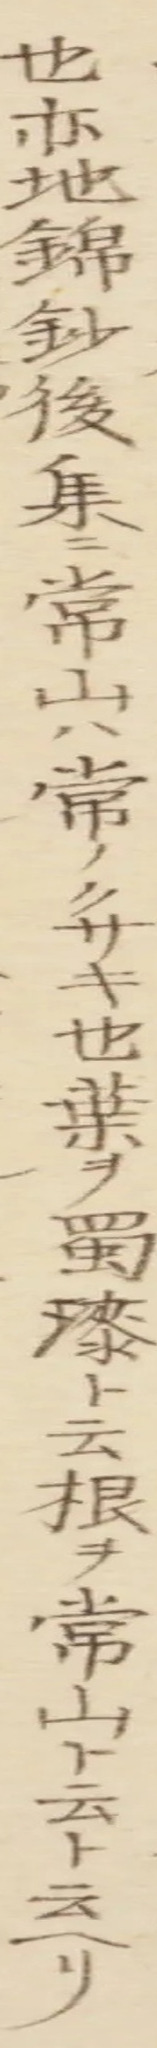也亦地錦鈔後集ニ常山ハ常ノクサキ也葉ヲ蜀漆ト云根ヲ常山ト云ト云ヘリ
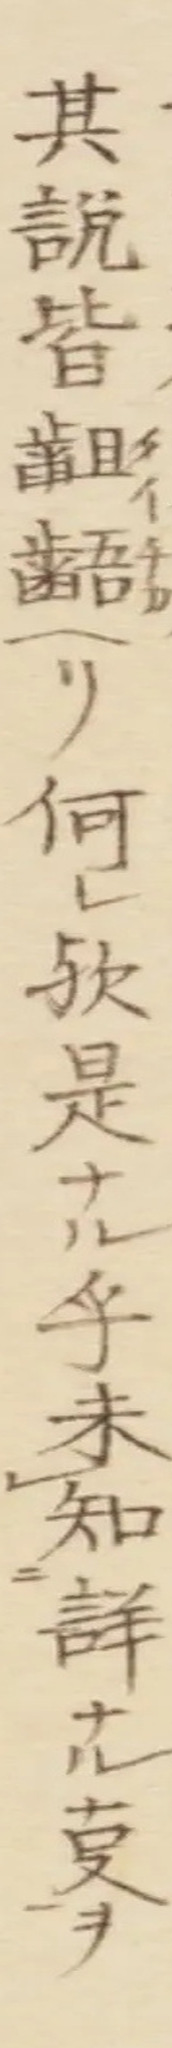其説皆齟齬ヘリ何レ歟是ナル乎未知詳ナル事ヲ
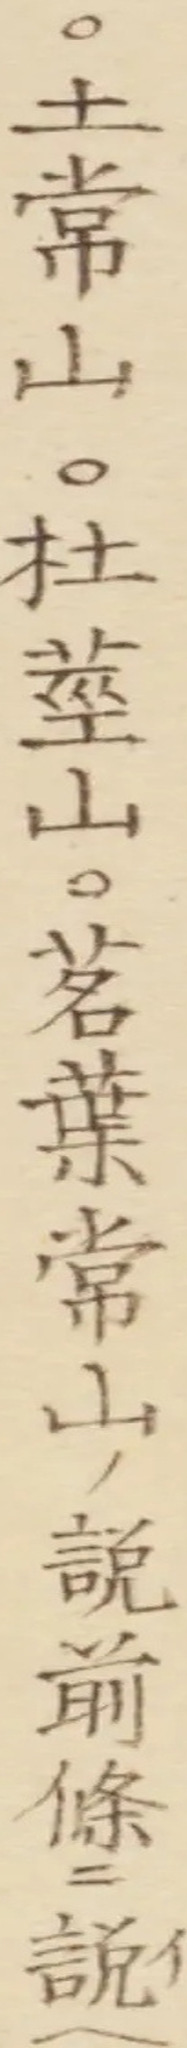◦土常山◦杜茎山◦茗葉常山ノ説前条ニ説ヘリ

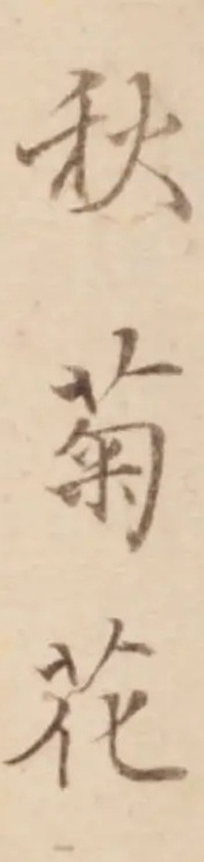秋菊花
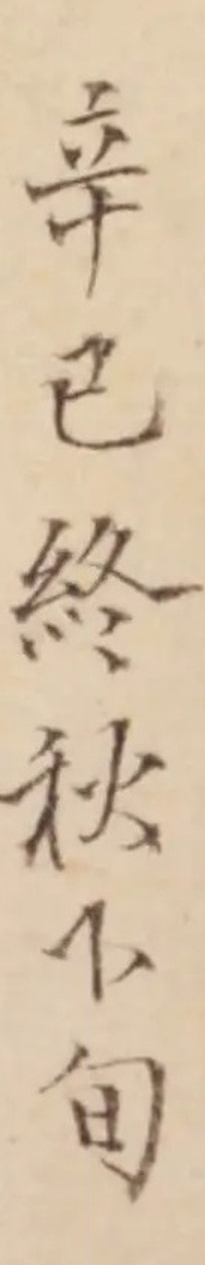辛巳終秋下旬
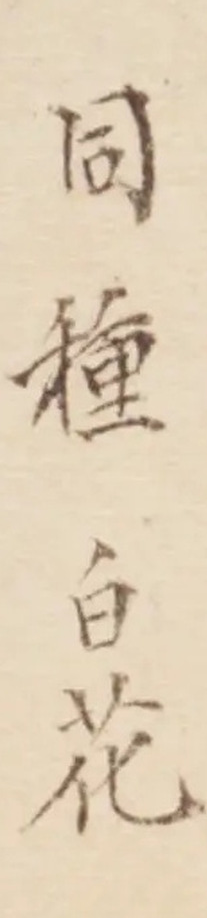同種白花

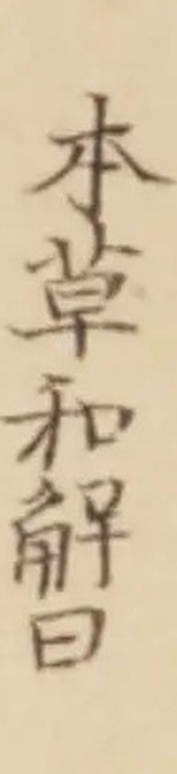本草和解曰
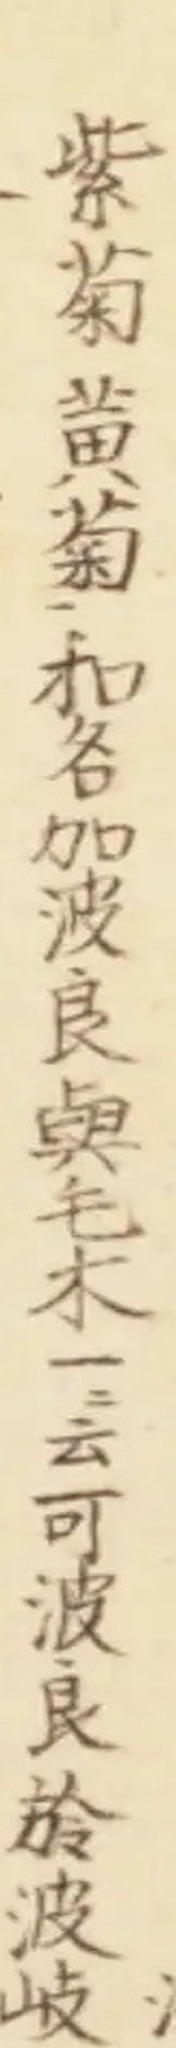紫菊黄菊和名加波良与毛木一云可波良𣃠波岐
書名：梅園草木花譜秋之部. 1
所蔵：国立国会図書館 National Diet Library, JAPAN
